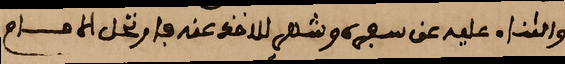والثناء عليه عن سفره وشهر للاخذ عنه فارتحل الامام
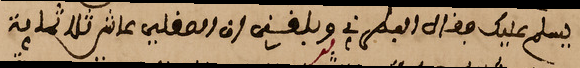يسلم عليك فقال البطرني وبلغني ان الصقلي عاش ثلاثماية
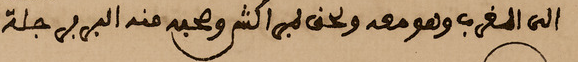الى المغرب وهو معه ولحق بمراكش وصحبه منه البربر جلة
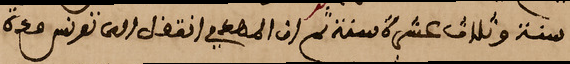سنة وثلاث عشرة سنة ثم ان المهدي انتقل الى تونس مدة
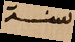سنة
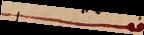قف
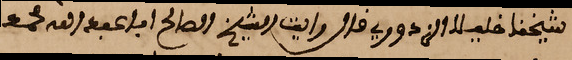شيخنا خليلا الزدوري قال رايت الشيخ الصالح ابا عبد الله محمد
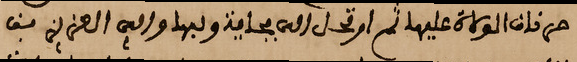صرنان الولاة عليها ثم ارتحل الى بجاية وبها والي العزيز بن
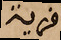قرية
